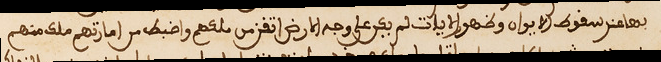بها عند سقوط الايوان وظهور الابيات لم يكن على وجه الارض اتقن من ملكهم واضبط من امارتهم ملك منهم
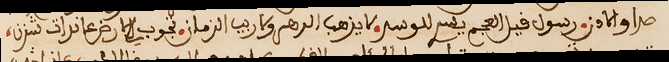صراو الادن رسول قيل العجم يسرى للوسد لا يذهب الدهر ولا ريب الزمان تجوب في الارض عاندات شذن
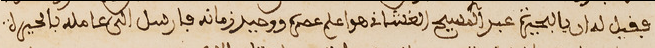فقيل له ان بالبحيرة عبد المسيح الغشانى هو اعلم عصره ووحيد زمانه فارسل الى عامله بالحيرة
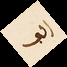الف
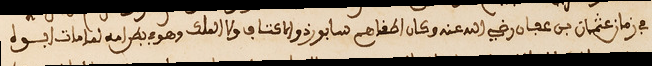في زمان عثمان بن عفان رضي الله عنه وكان اطغاهم سابور ذو الاكتاف ولا الملك وهو في بطن امه لما مات ابوه
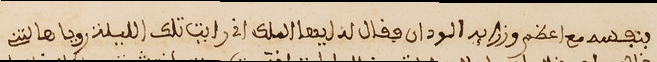بنفسه مع اعظم وزرائه السودان فقال له ايها الملك انى رايت تلك الليلة روياها لتنى
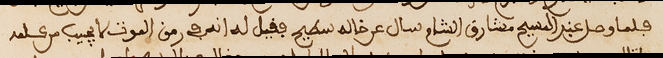فلما وصل عبد المسيح مشارق الشام سال عن خاله سطيح فقيل له انه في رمق الموت لا يجيب من كلمه
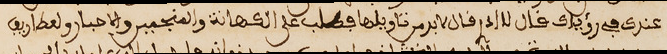عندك في رؤياك قال لا ادرى قال لا بد من تاويلها فطلب على الكهانة والمنجمين والاحبار ولعطاريف
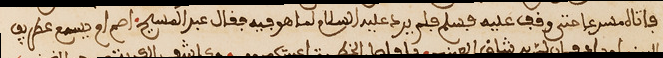فاتاه مسرعا حتى وقف عليه فسلم فلم يرد عليه السلام لما هو فيه فقال عبد المسيح اصم ام يسمع عطريف
